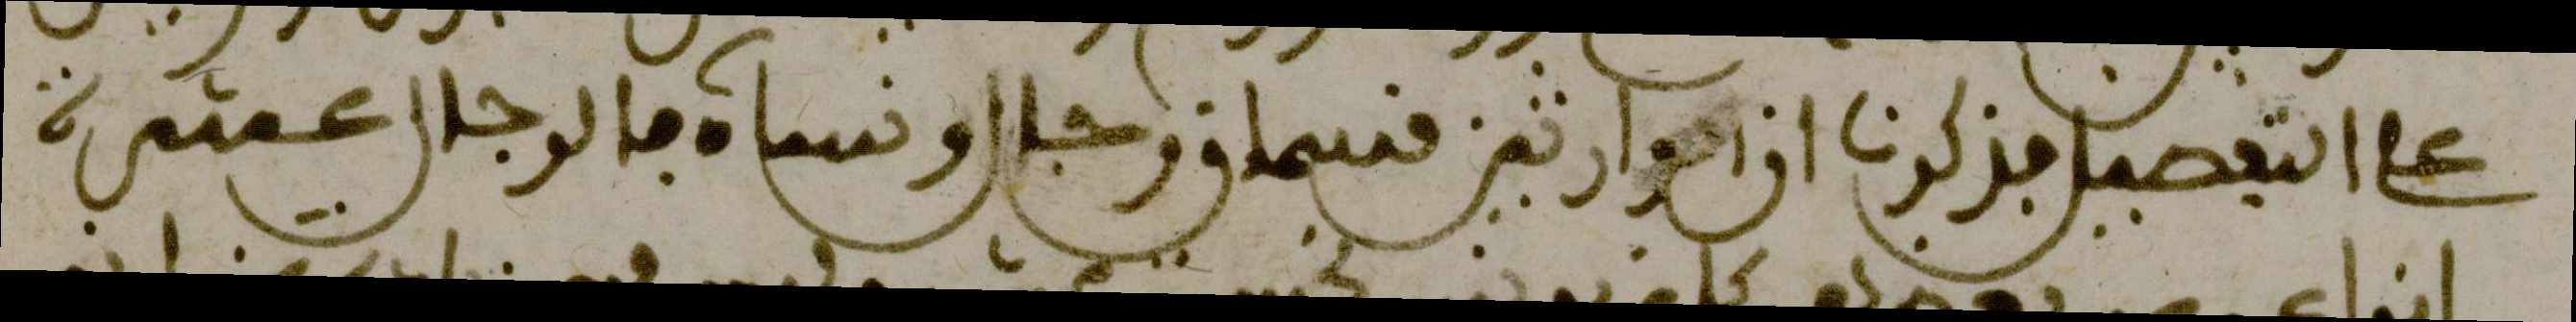على التفضيل فذكرنا ان الوارثين قسمان رجال ونساء فالرجال عشرة
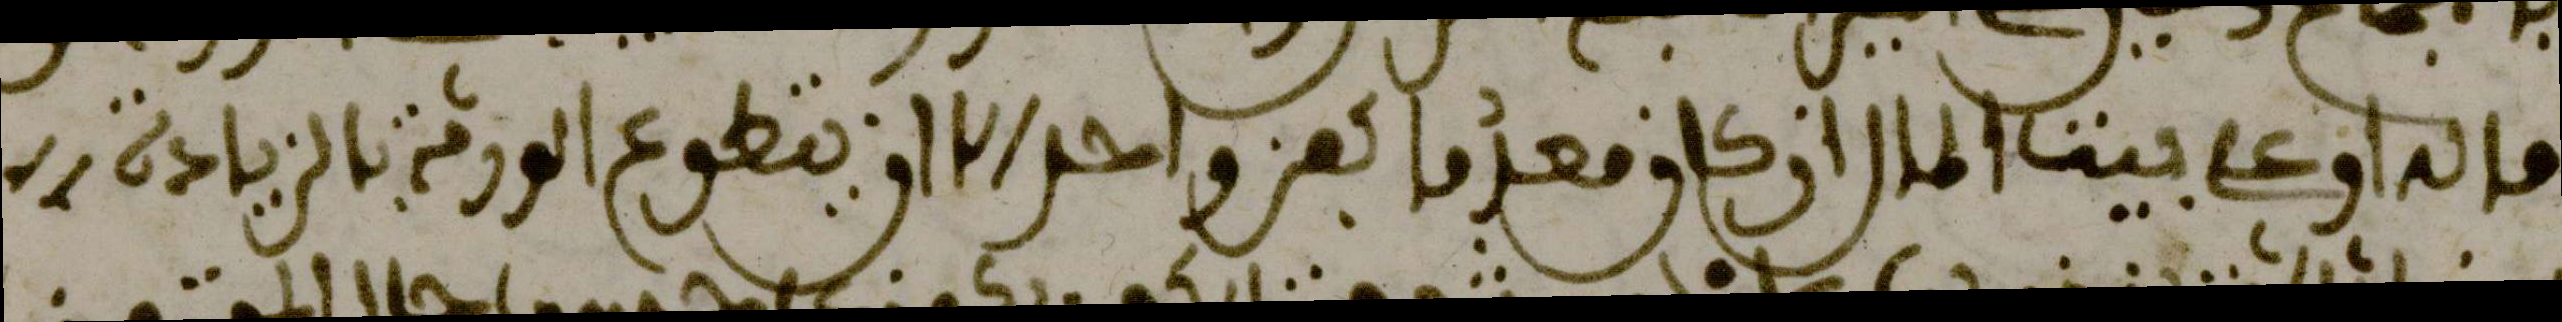ماله او على بيت المال ان كان معدما كفن واحد الا ان يتطوع الورثة بالزيادة
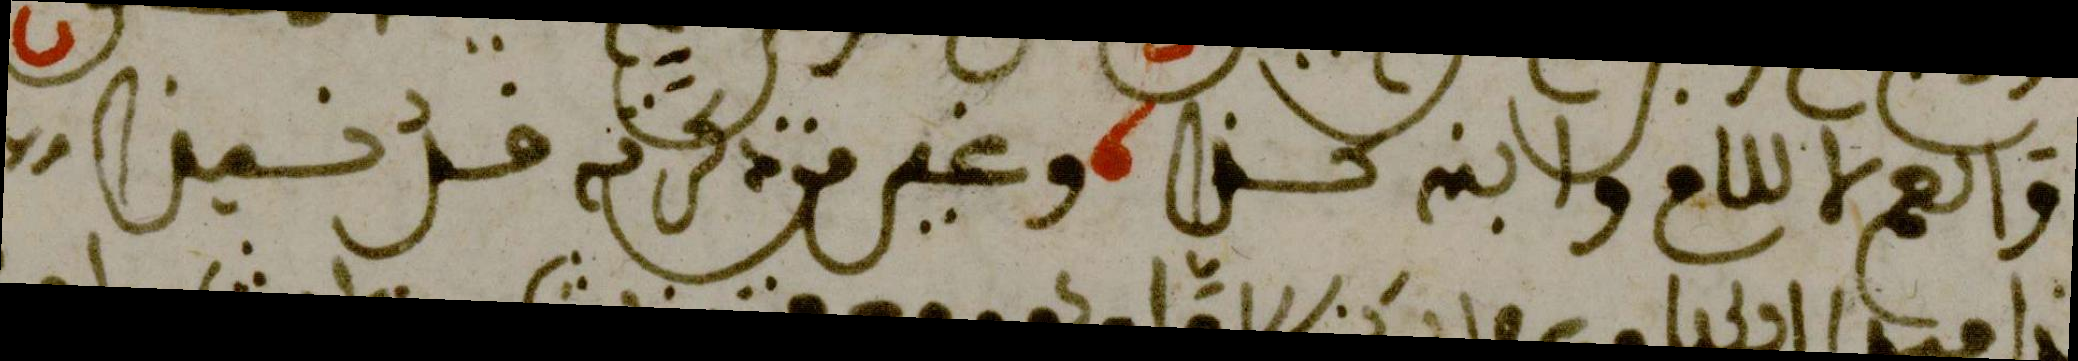وَالعم لا للام وابنه كذا وغير من ذكرته قد نبذا
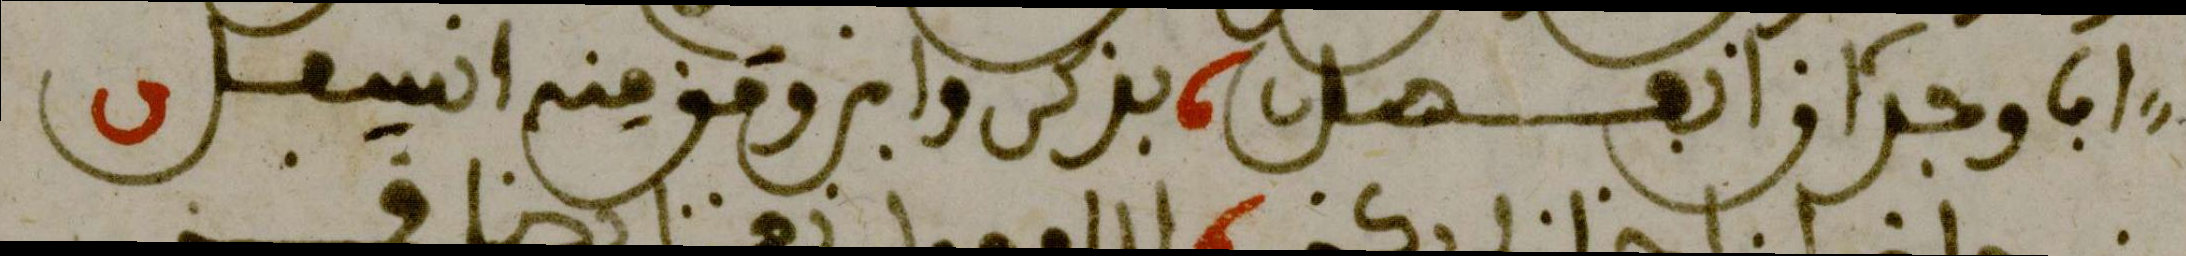اب وجد ان انفصل بذكر وابن ومَن مِنه انسفل
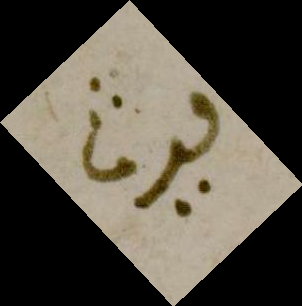يرث
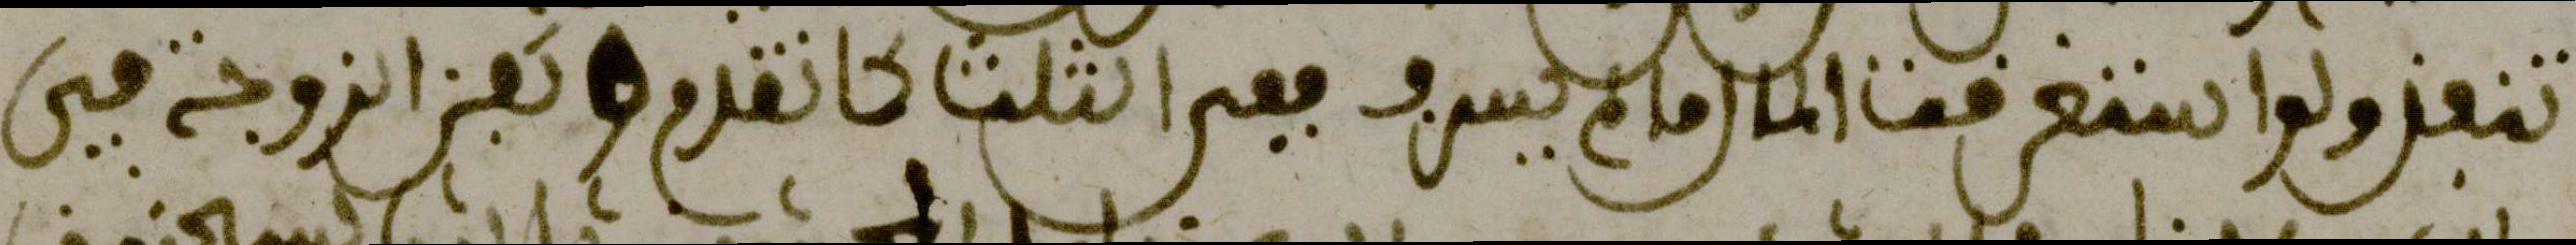تنفذ ولو استغرقت المال ما لم يسرف ففى الثلث كما تقدم وَكفن الزوجة في
